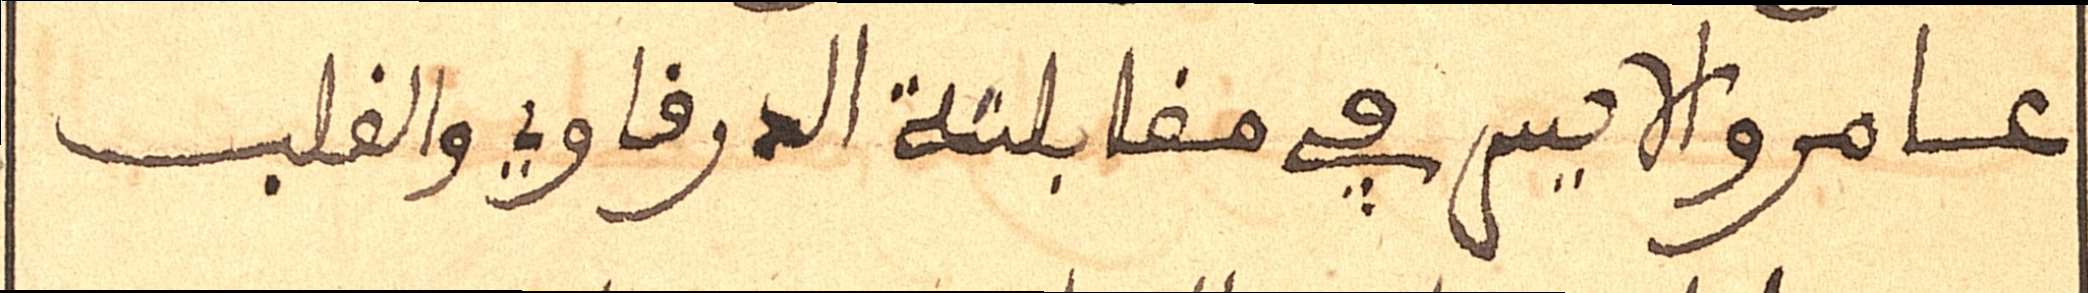عامرو الايسر في مقابلتة الدرقاوي والقلب
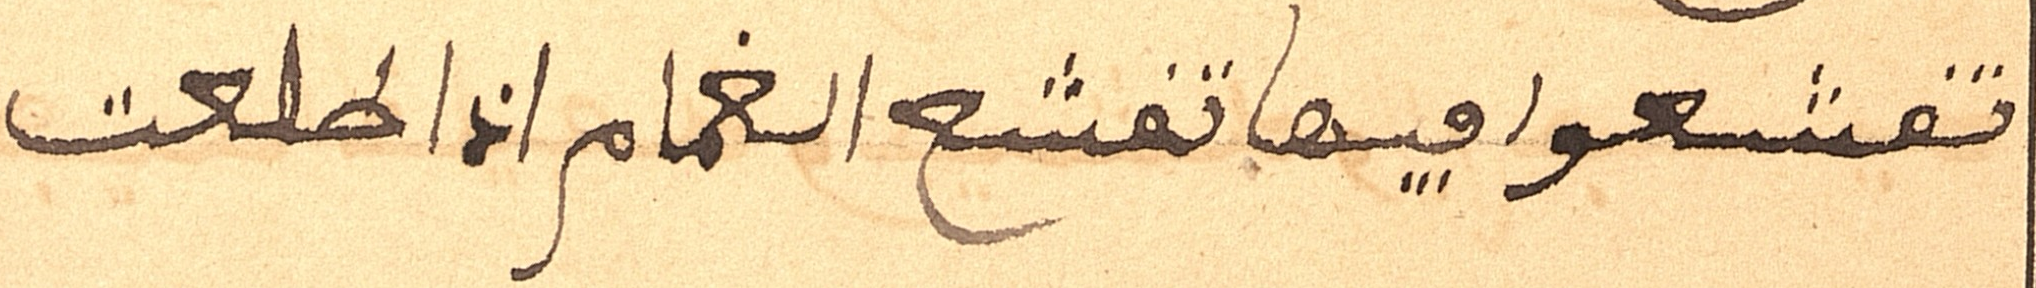تقشعوا فيها تقشع الغمام اذا طلعت
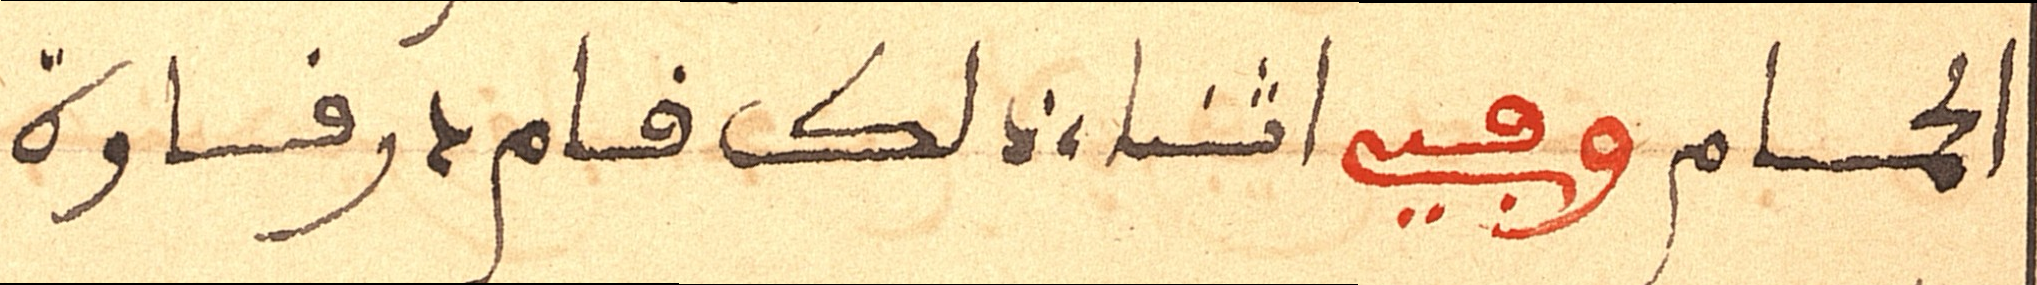الحمام وفي اثناء ذلك قام درقاوة
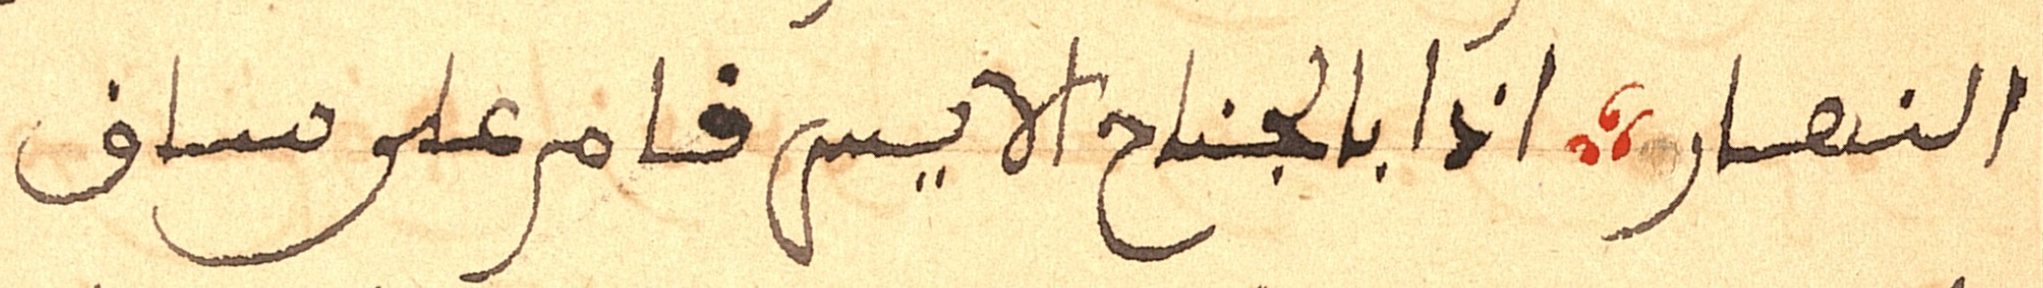النهار اذا بالجناح الايسر قام على ساق
